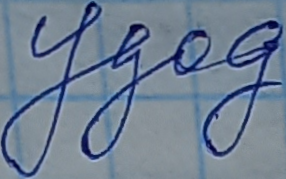удод
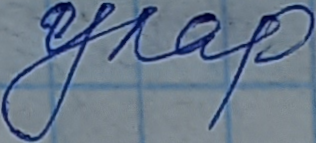улар
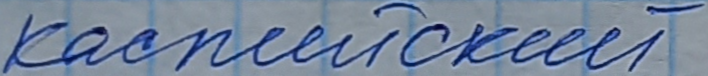каспийский
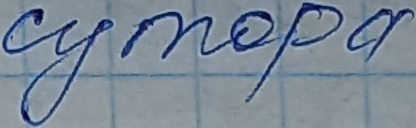сутора
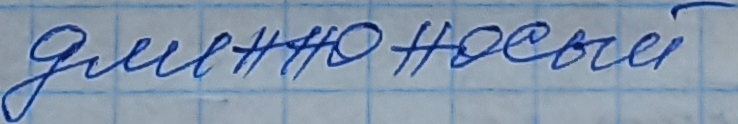длинноносый
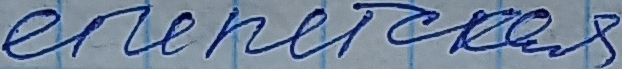египетская
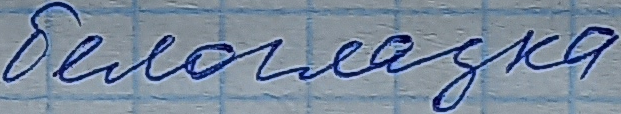белоглазка
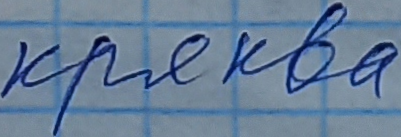кряква
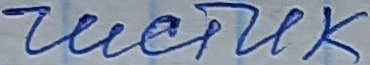чистик
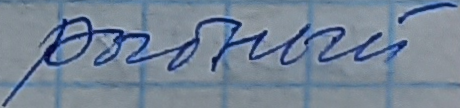рыбный
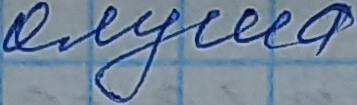олуша
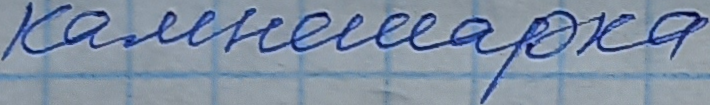камнешарка
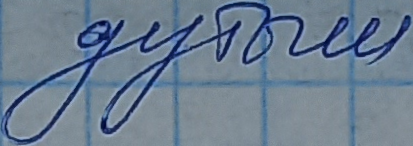дутыш
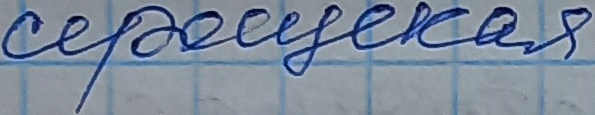серощекая
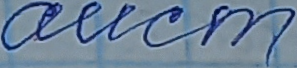аист
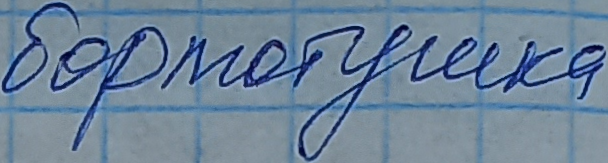бормотушка
